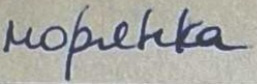морянка
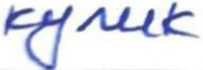кулик
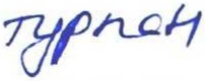турпан
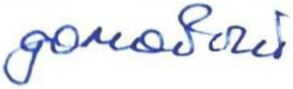домовый
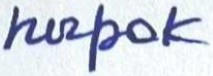пырок
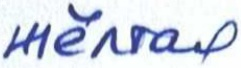жёлтая
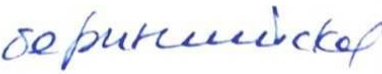берингийская
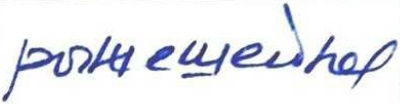рыжешейная
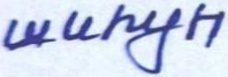шипун
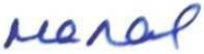мелая
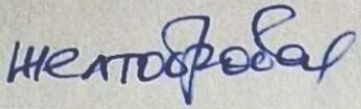желтобровая
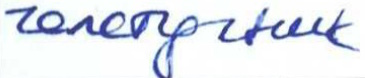голстучник
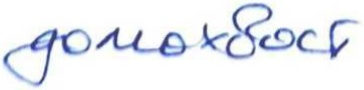долгохвост
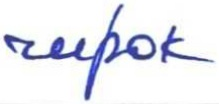чирок
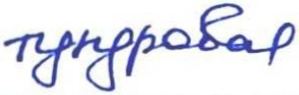тундровая
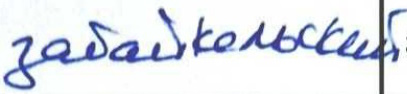забайкольский
